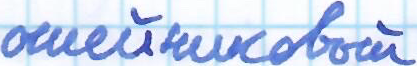ошейниковый
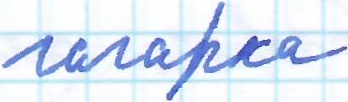гагарка
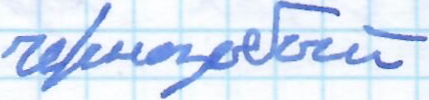чернозобый
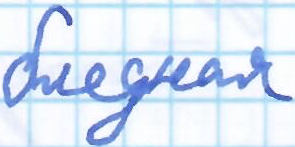бледная
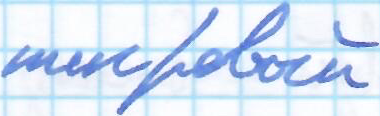тигровый
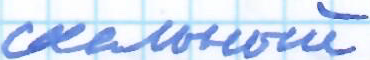скальный
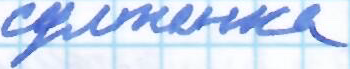султанка
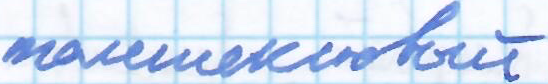толстоклювый
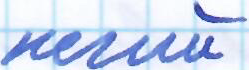пегий
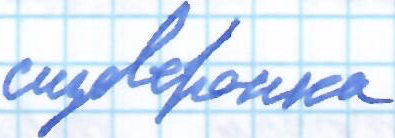сизоворонка
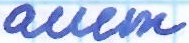аист
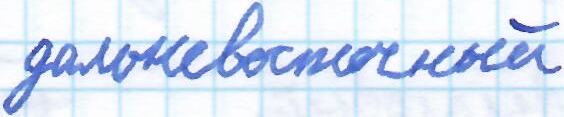дальневосточный
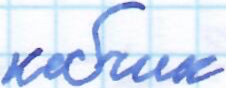кобчик
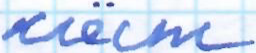клёст
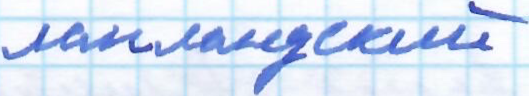лапландский
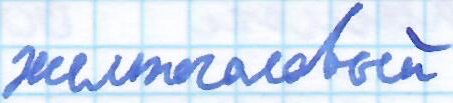желтоголовый
